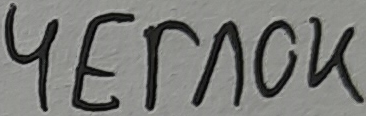чеглок
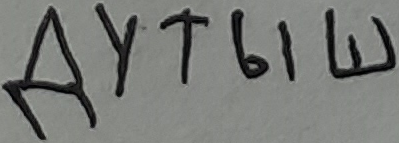дутыш
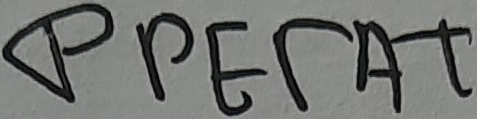фрегат
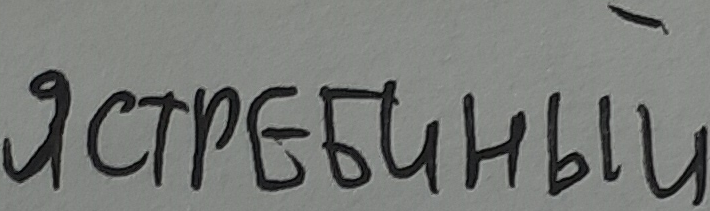ястребиный
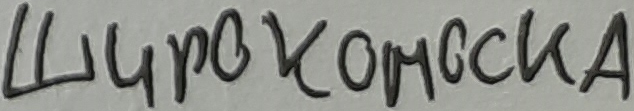широконоска
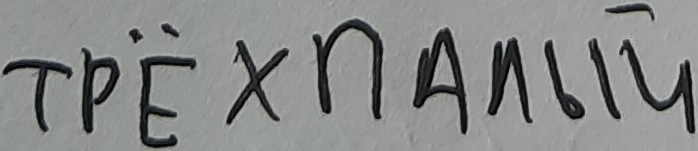трёхпалый
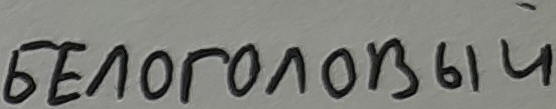белоголовый
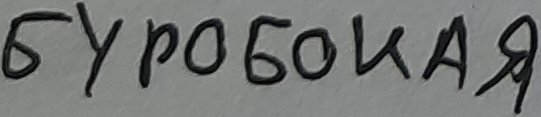буробокая
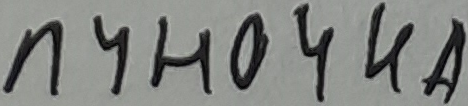пуночка
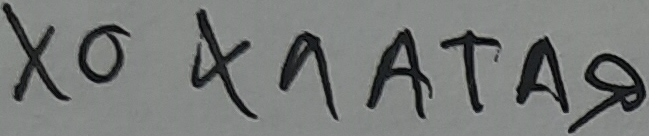хохлатая
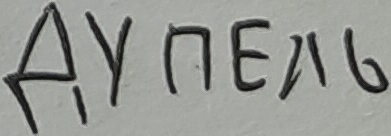дупель
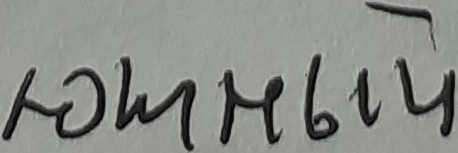южный
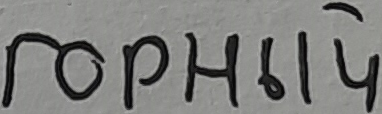горный
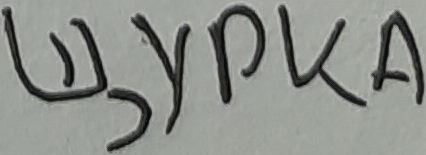щурка
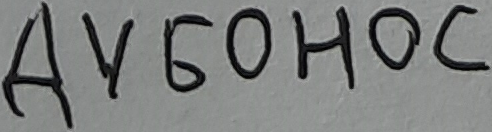дубонос
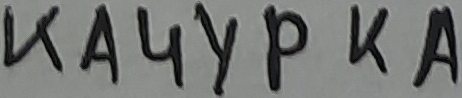качурка
